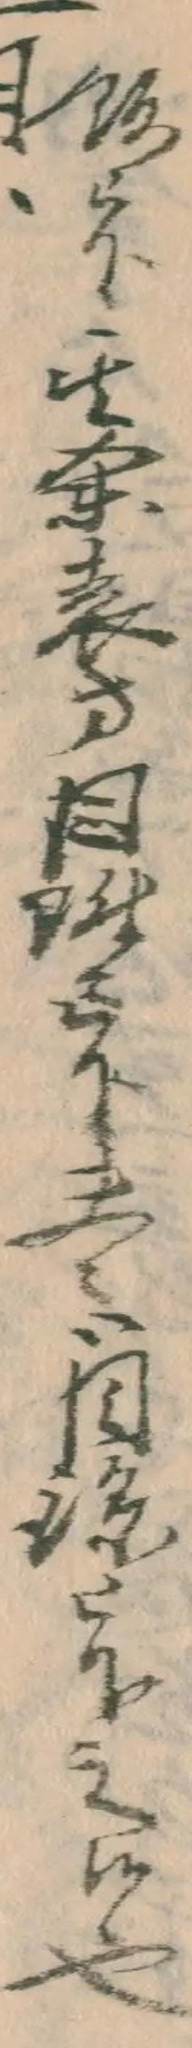飯已下其余表方目附已下夫々御目録被下之候也
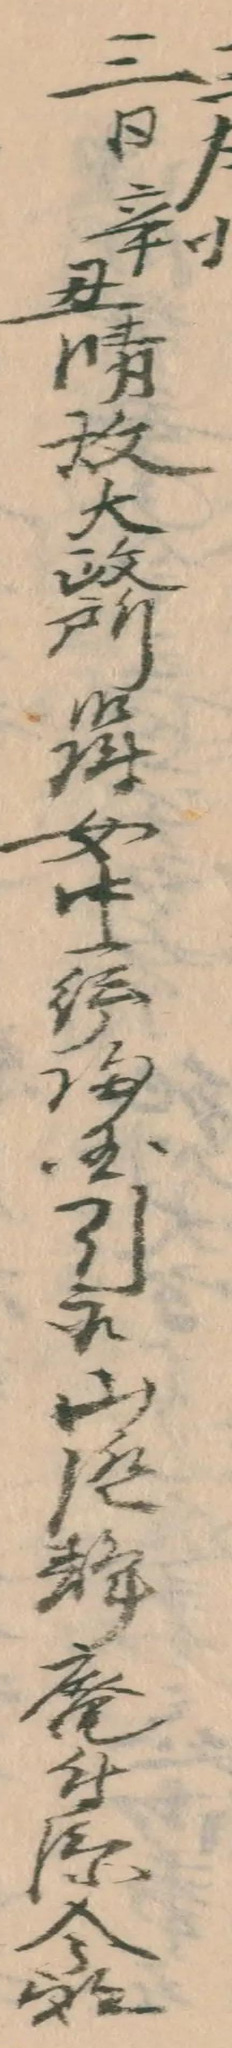三日辛丑晴故大政所御附女中一統帰国引取山路静庵付添今朝
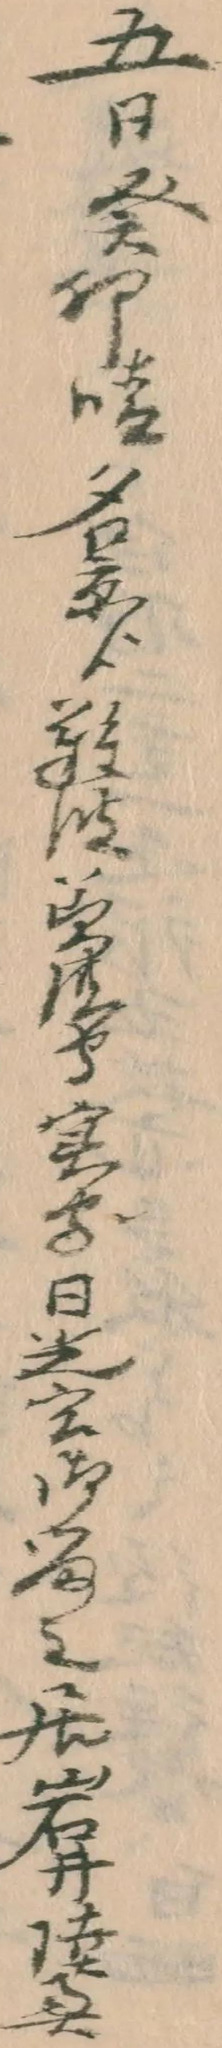五日癸卯晴夕方ゟ難渋美濃守実家日光宮御留主居岩井陸奥
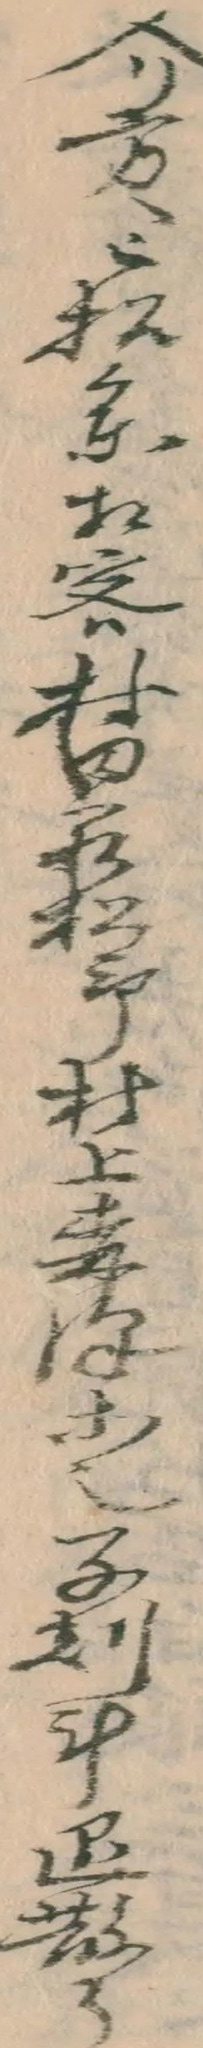介方へ被招参相客村田喜松予村上壽沢等也子刻斗退散了
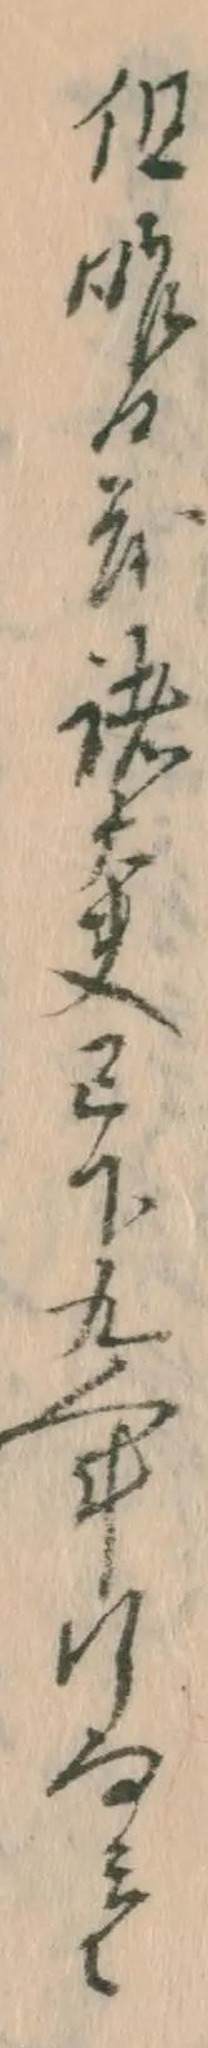但昨日も諸大夫已下九人斗行向云々
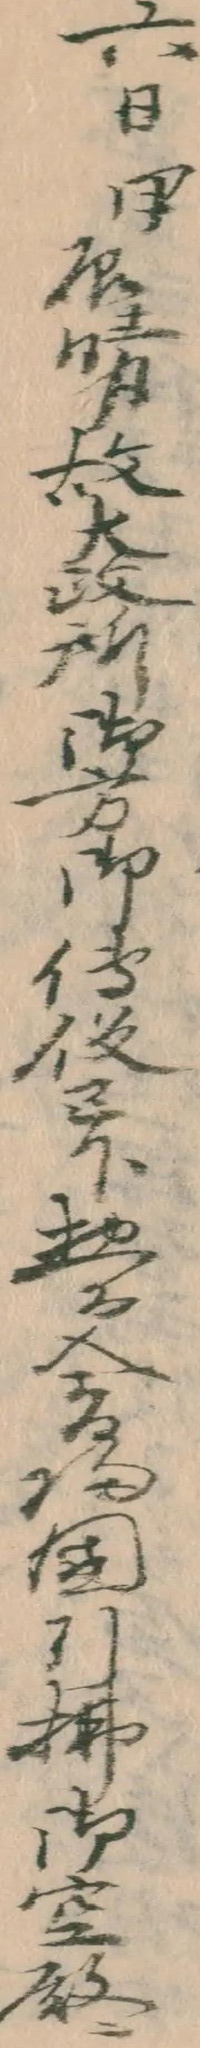六日甲辰晴故大政所御方御侍役已下惣而今日帰国引払御室殿ニ
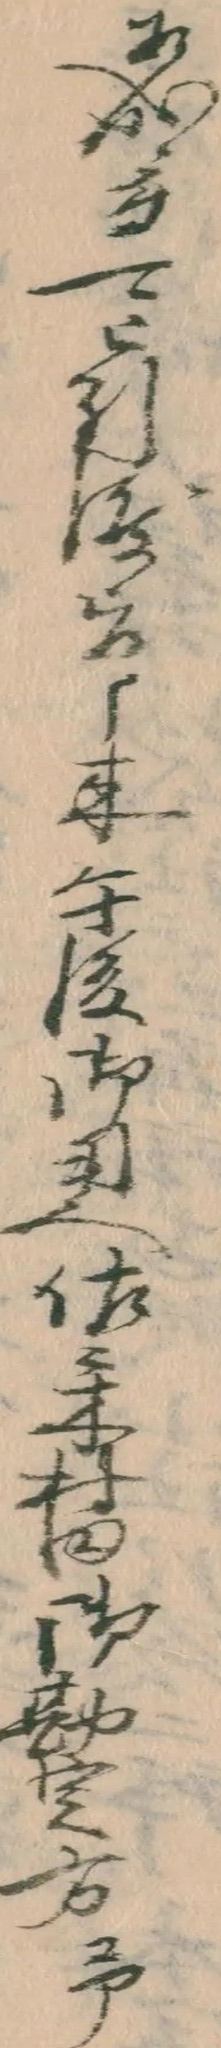相成ニ付可被引渡旨申来午後御用人佐々木村田御勘定方予
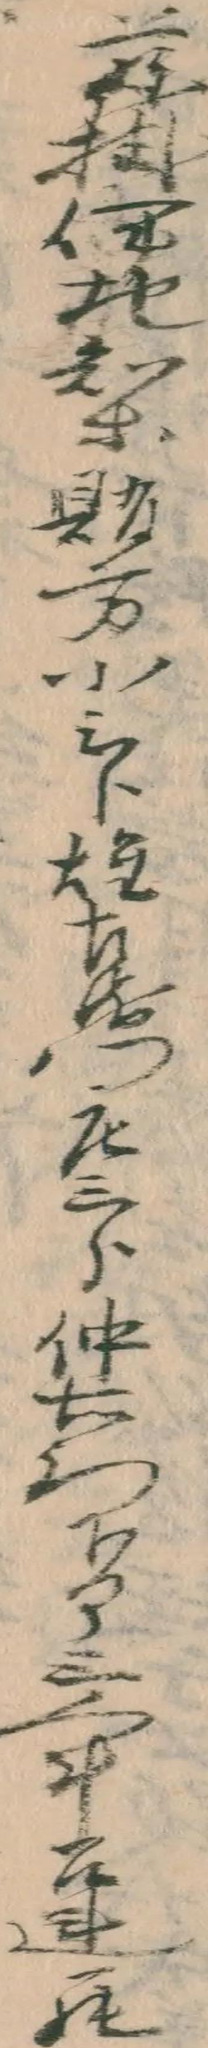蔵掛伊地知等賄方小三郎権左衛門庄三郎仲右衛門下戸三人斗召連罷
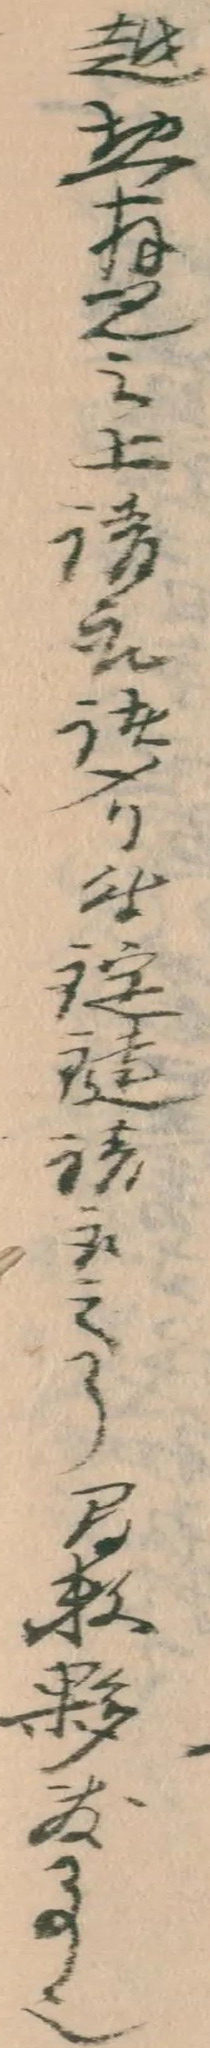趣惣拝見之上請取諸〆り付諚謰請取之了間数夥敷事也
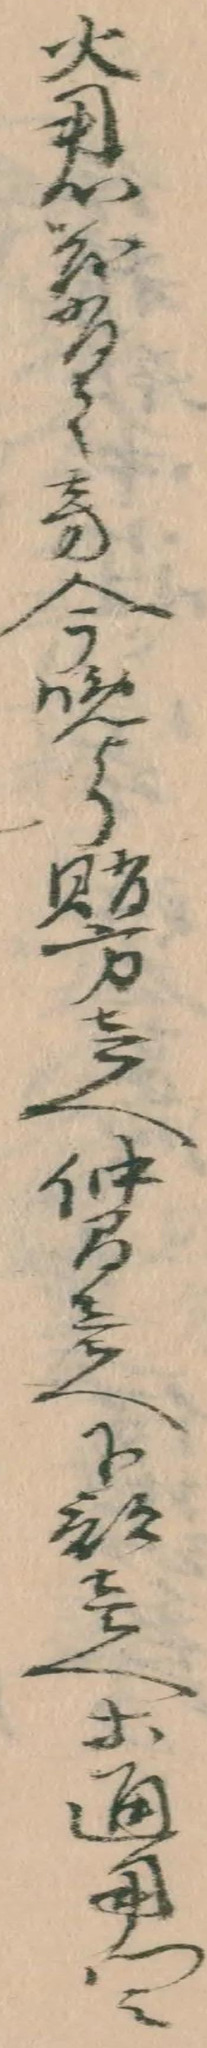火用心も有之方今晩より賄方壱人仲間壱人下部壱人等通用門之
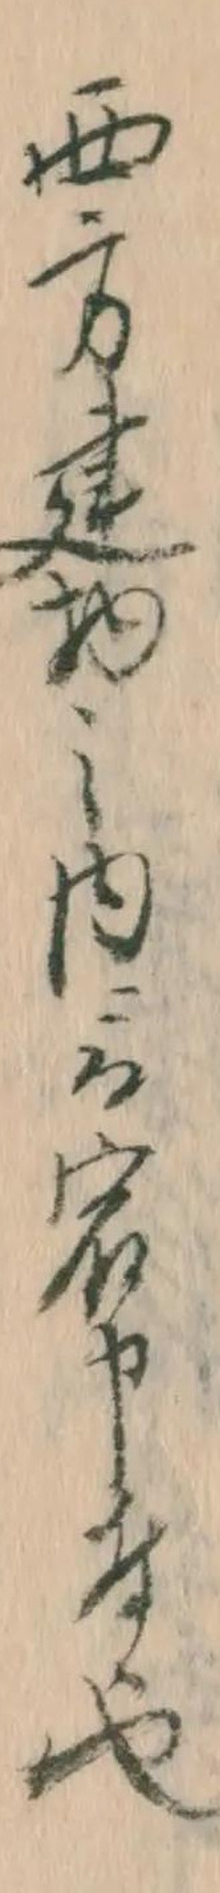西方建物之内ニ而宿申付也
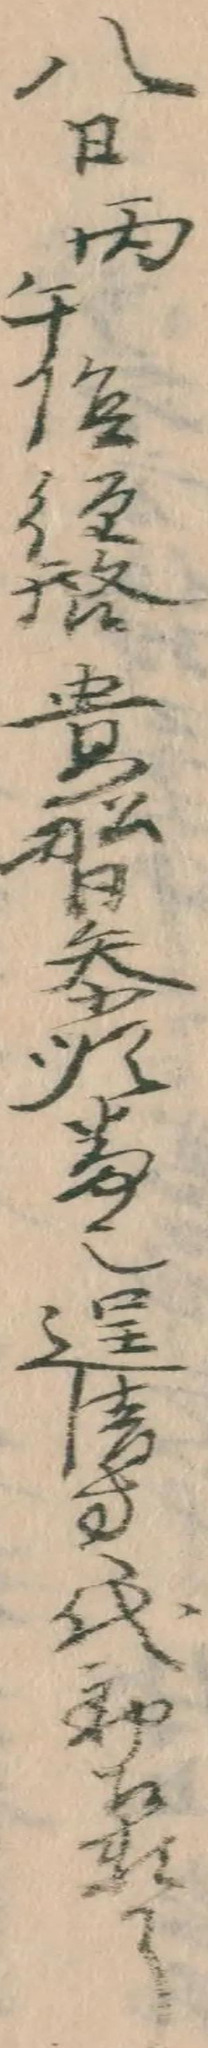八日丙午後経啓貴舩日参順番也逞清方へ代勤相頼了
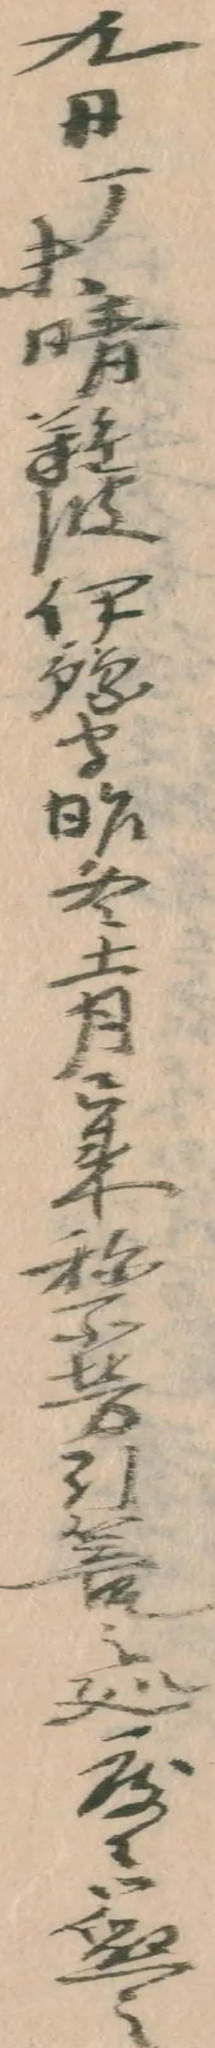九日丁未晴難波伊豫守昨冬十一月已来称所労引篭之処度々御懇之
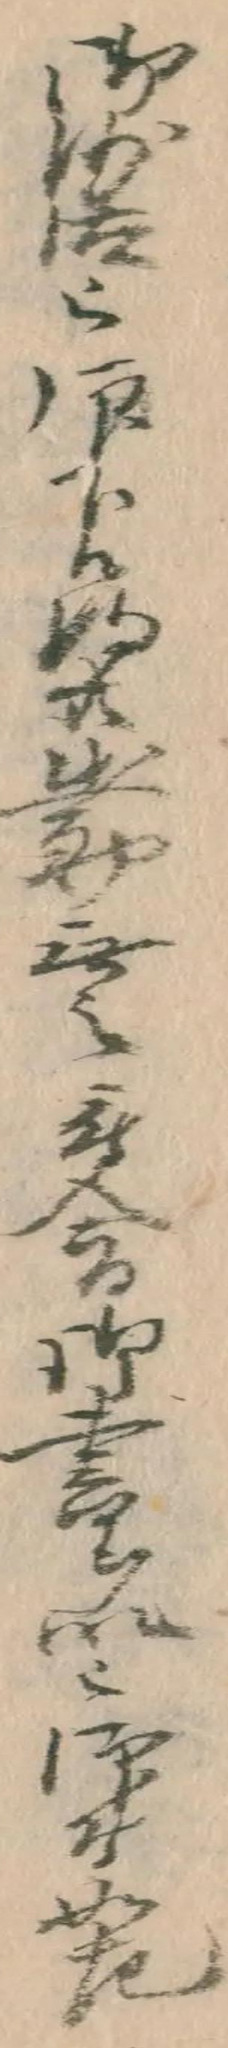御沙汰被仰下候得共出勤無之ニ付今日御書ヲ以被仰付如左
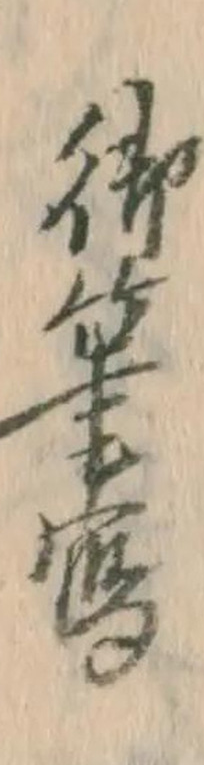御筆寫
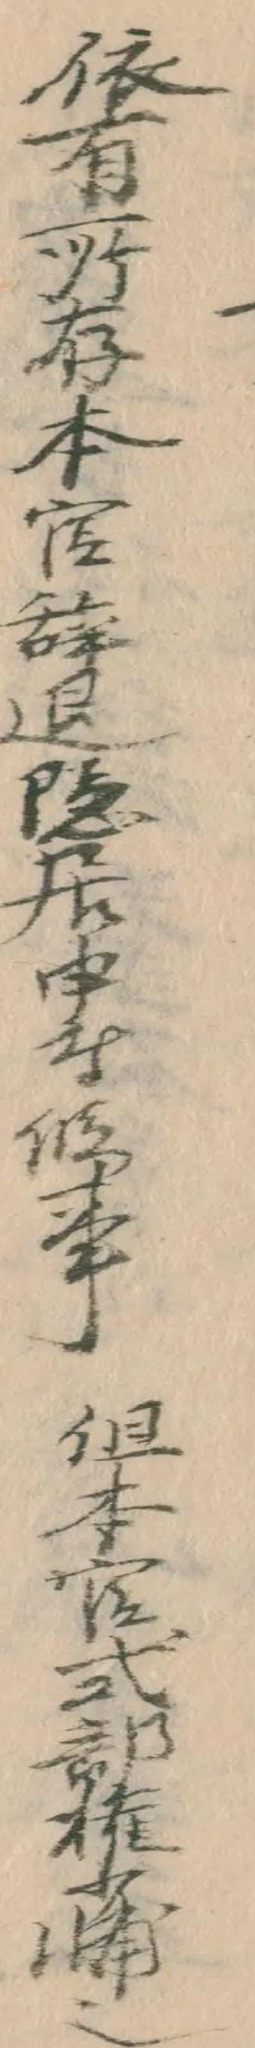依有所存本官辞退隠居申付候事但本官式部権少輔也
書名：賀茂社記録. 第69冊
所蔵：国立国会図書館 National Diet Library, JAPAN
